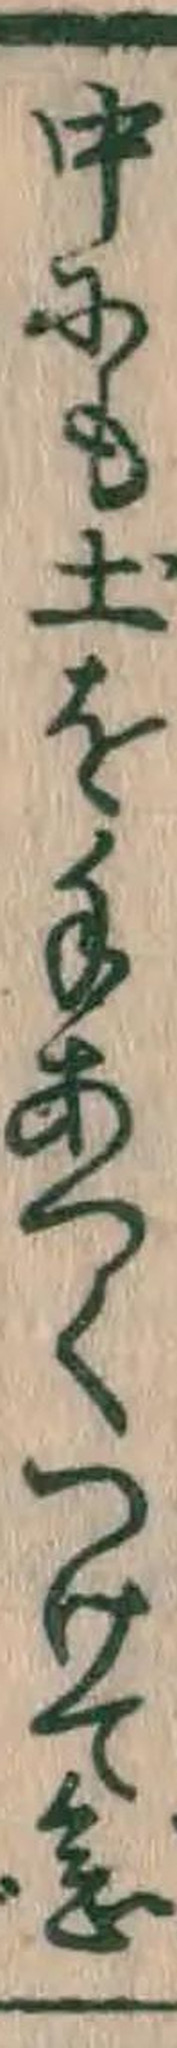中にも土を手あつくつけて念
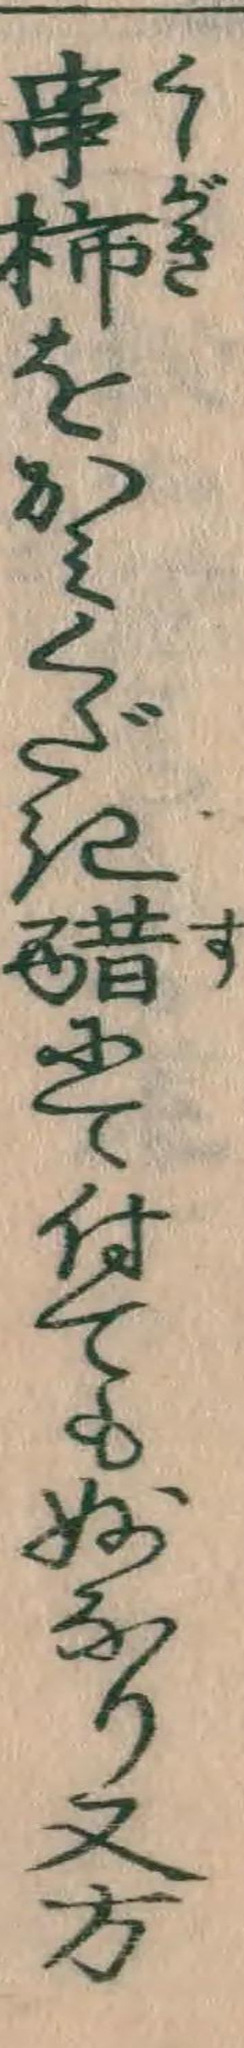串柿をかみくだき醋にて付ても妙なり又方
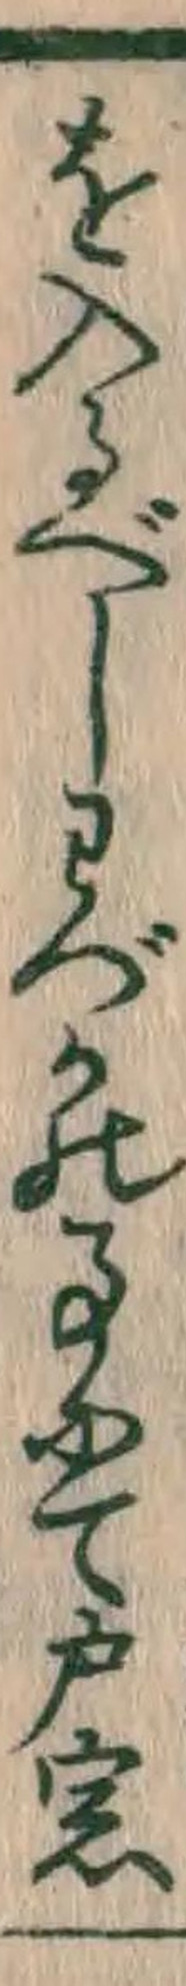を入るべしわづかの事にて戸窓
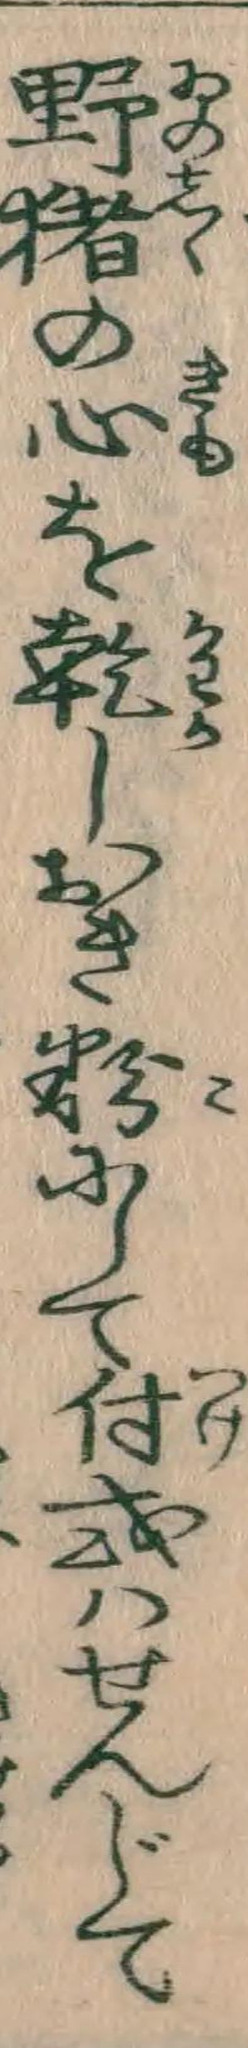野猪の心を乾しおき粉にして付或はせんじて
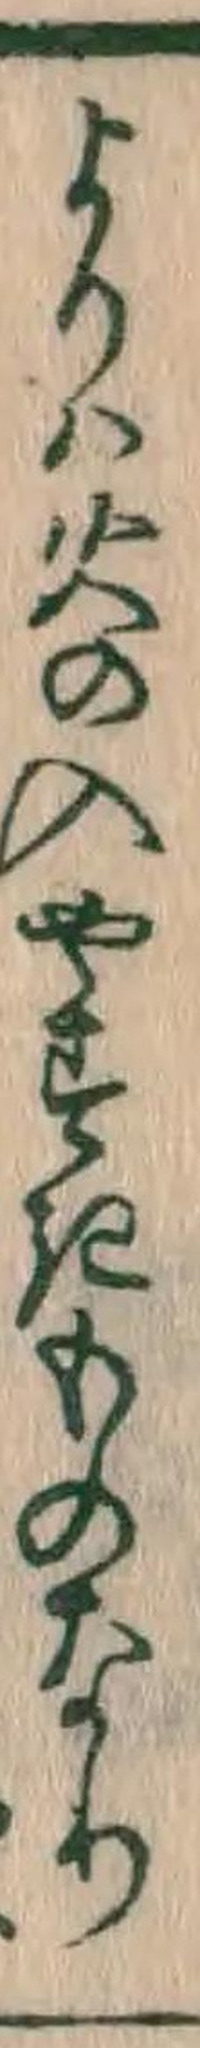よりは火の入やすきものなり
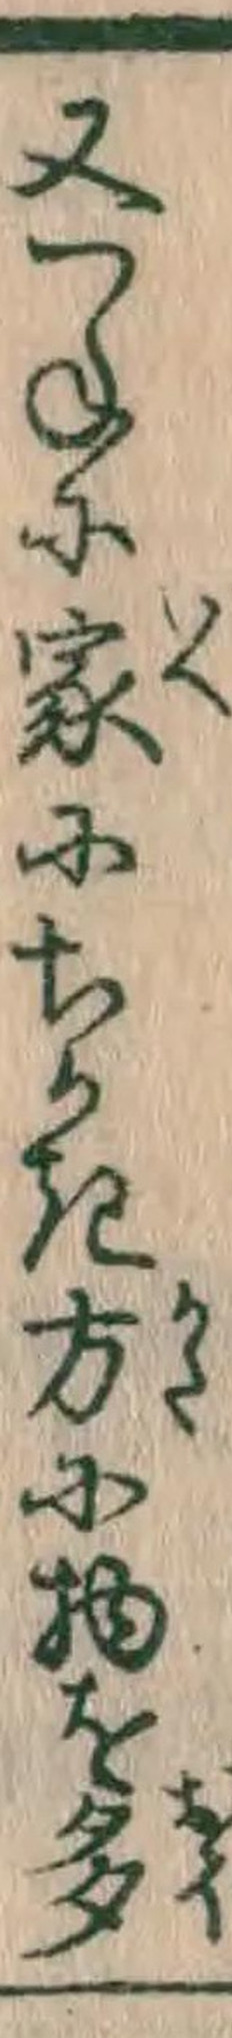又つねに家にちかき方に物を多
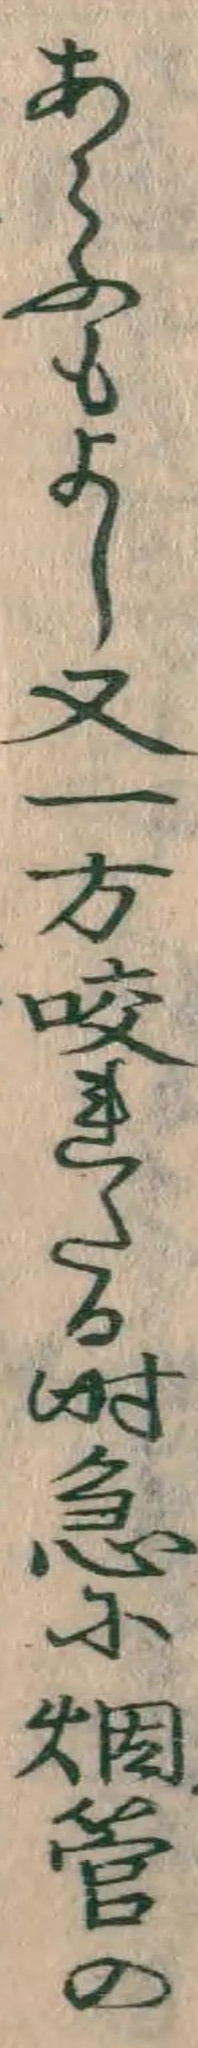あらふもよし又一方咬れたる時急に烟管の
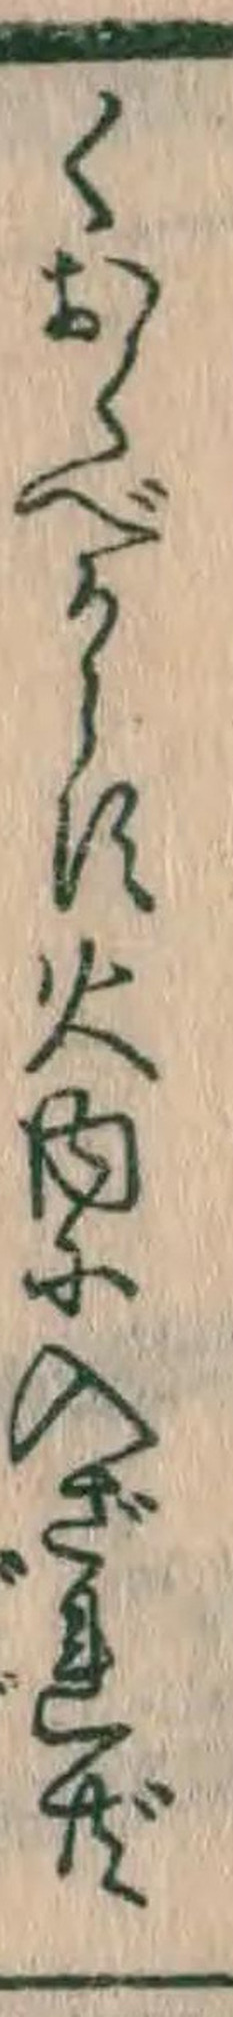くおくべからす火内に入ざれ共
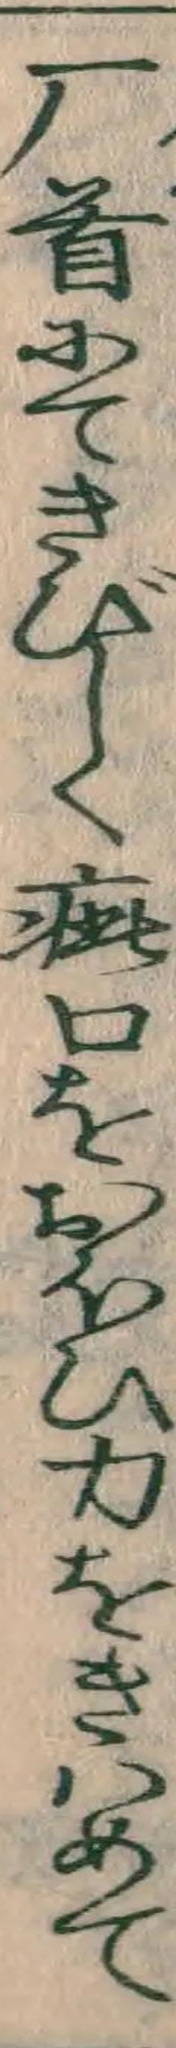厂首にてきびしく疵口をおほひ力をきはめて
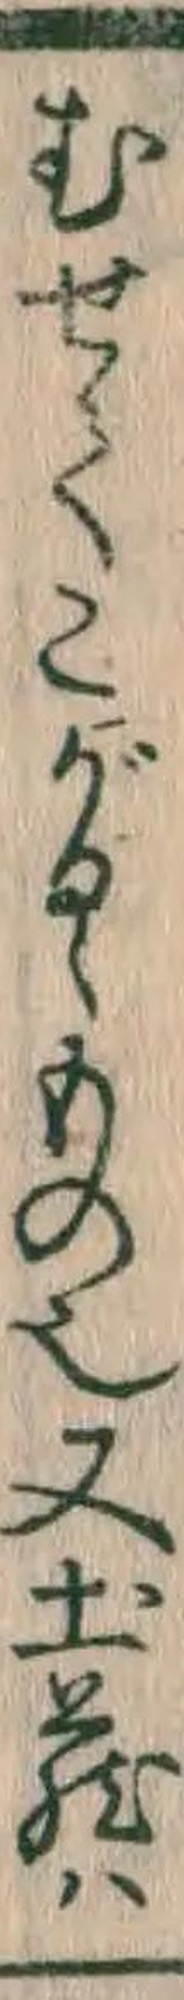むせてこがるゝもの也又土蔵は
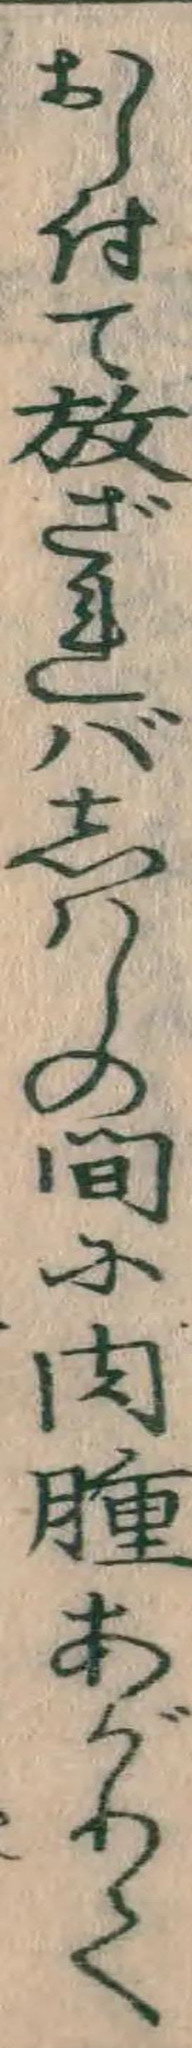おし付て放ざればしはしの間に肉腫あがりて
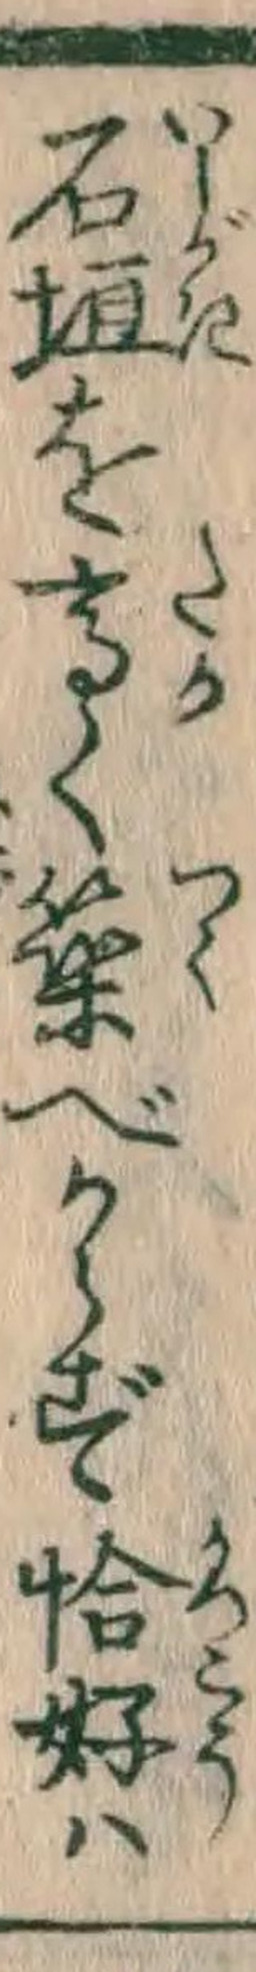石垣を高く築べからず恰好は
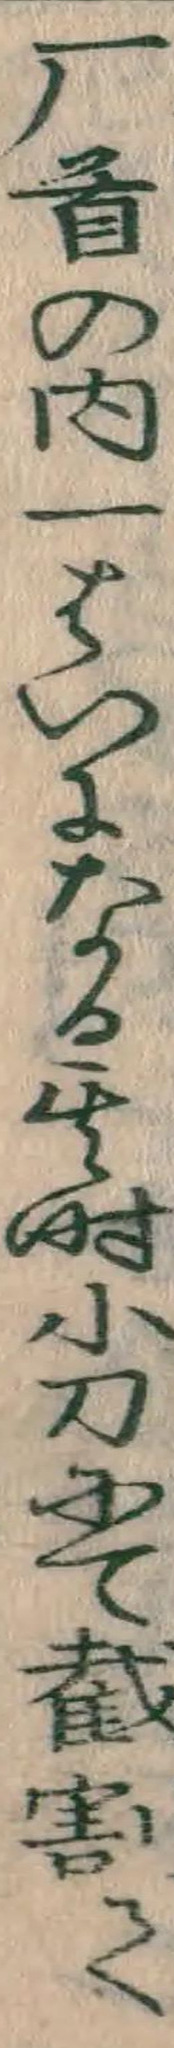厂首の内一はいになる其時小刀にて截割て
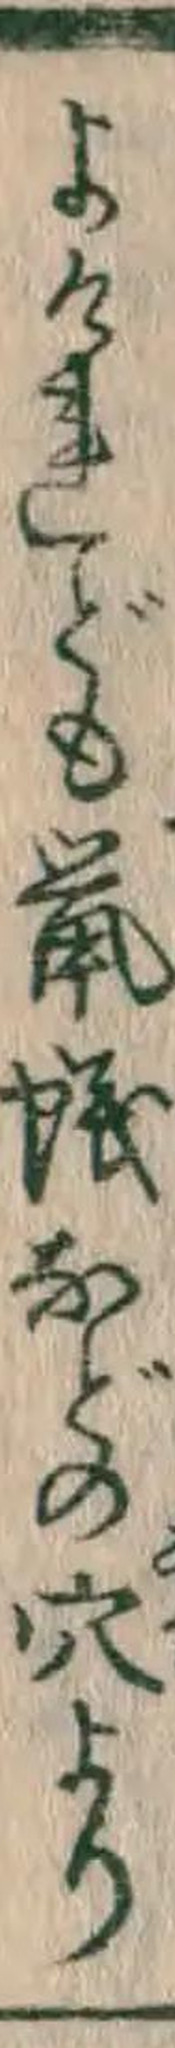よけれども鼠蟻などの穴より
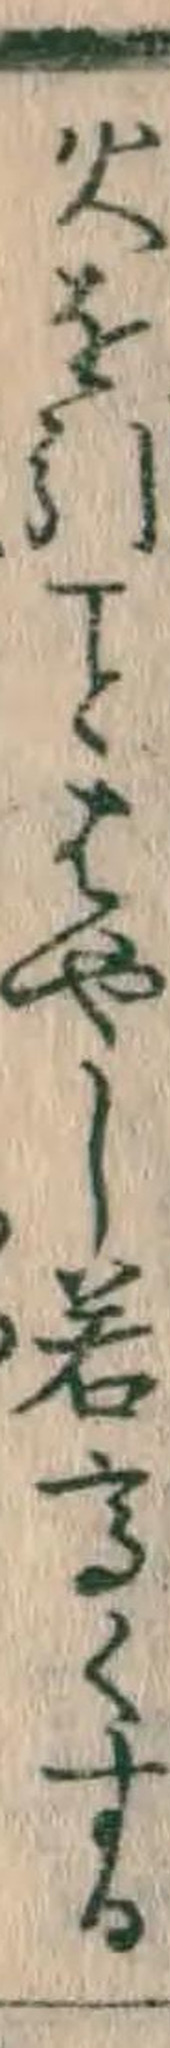火を引ことはやし若高くする
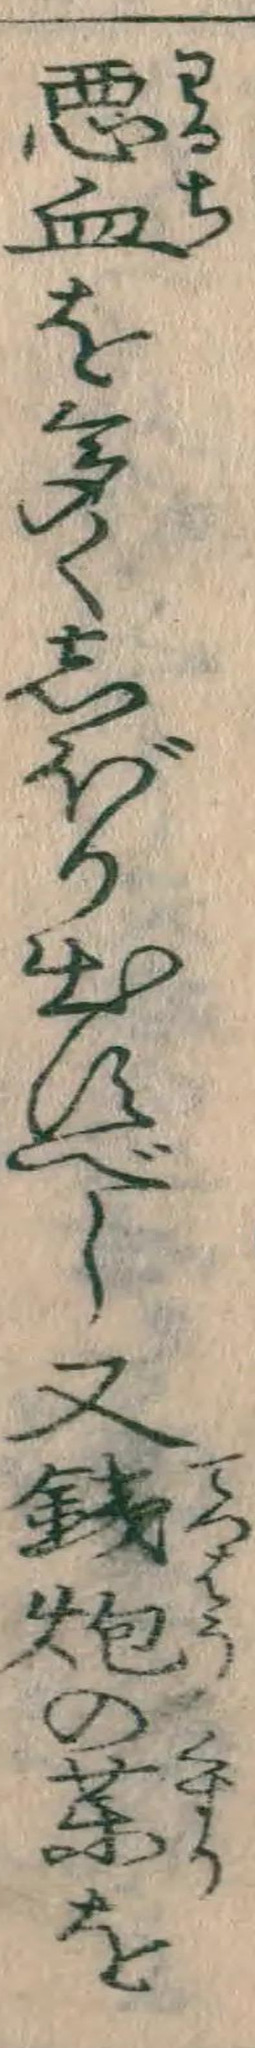悪血を多くしぼり出すべし又鉄炮の薬を
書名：広益秘事大全 3巻. [3]
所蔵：国立国会図書館 National Diet Library, JAPAN
